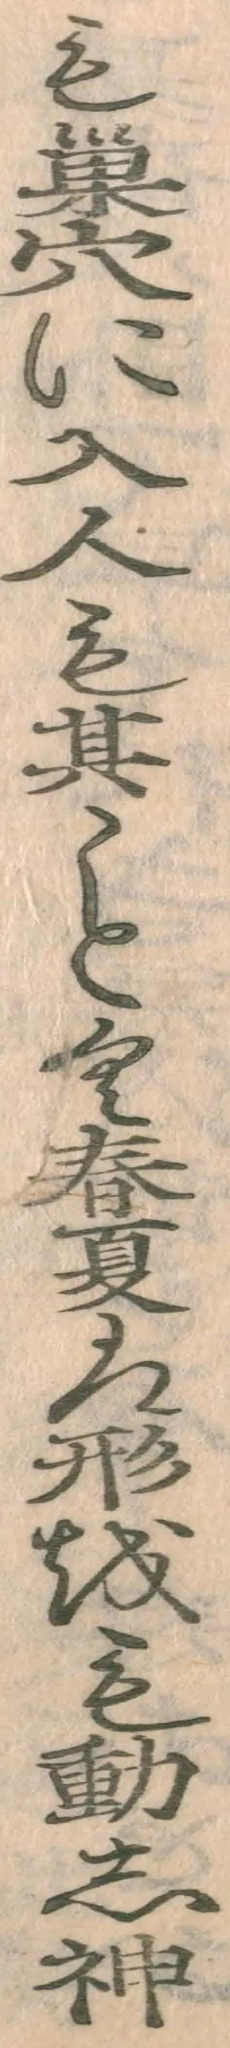も巣穴に入人も其ことく春夏は形をも動し神
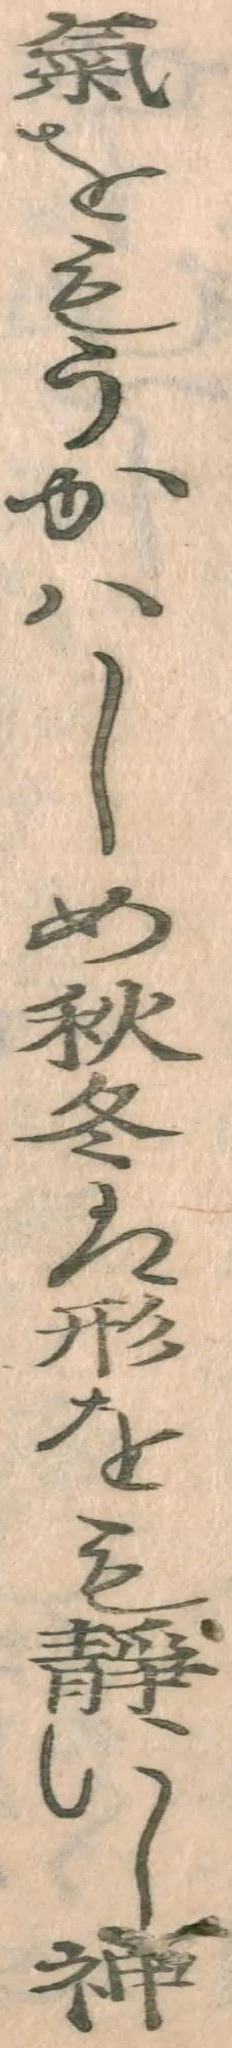気をもうかはしめ秋冬は形をも静にし神
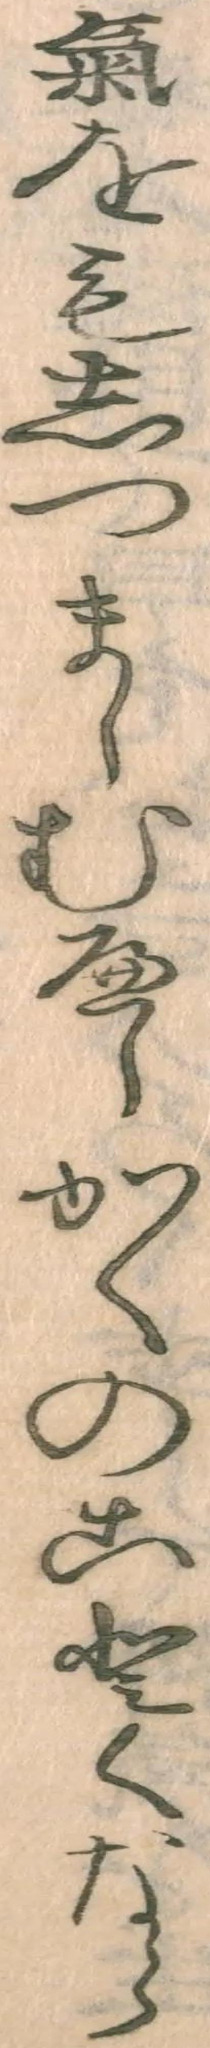気をもしつましむへしかくのことくなら
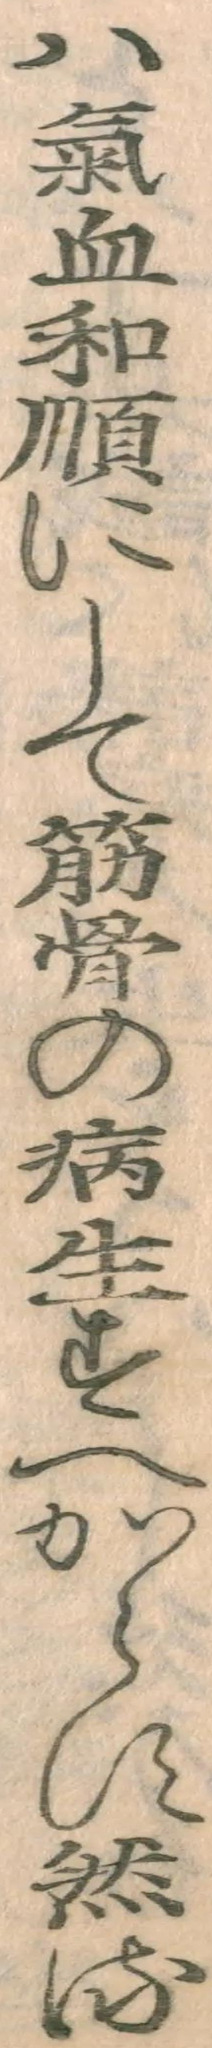は気血和順にして筋骨の病生すへからす然る
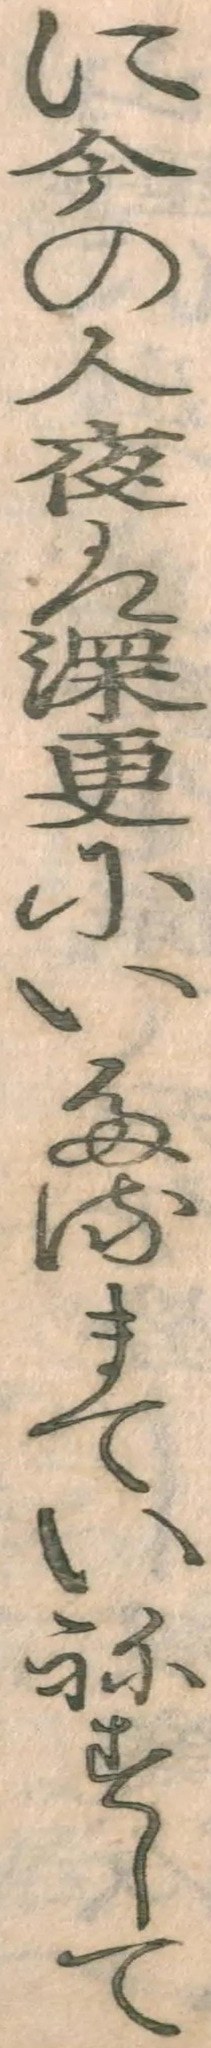に今の人夜は深更にいたるまていねすして
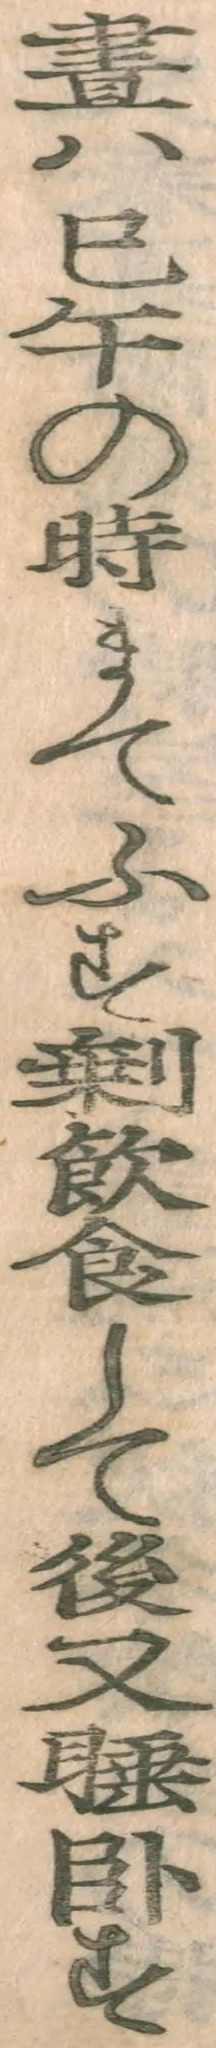昼は巳午の時まてふす剰飲食して後又睡臥し

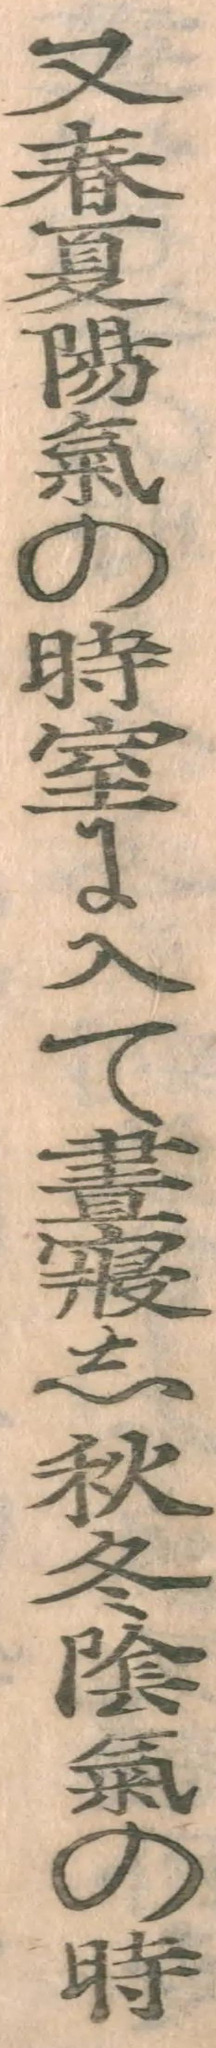又春夏陽気の時室に入て昼寝し秋冬陰気の時
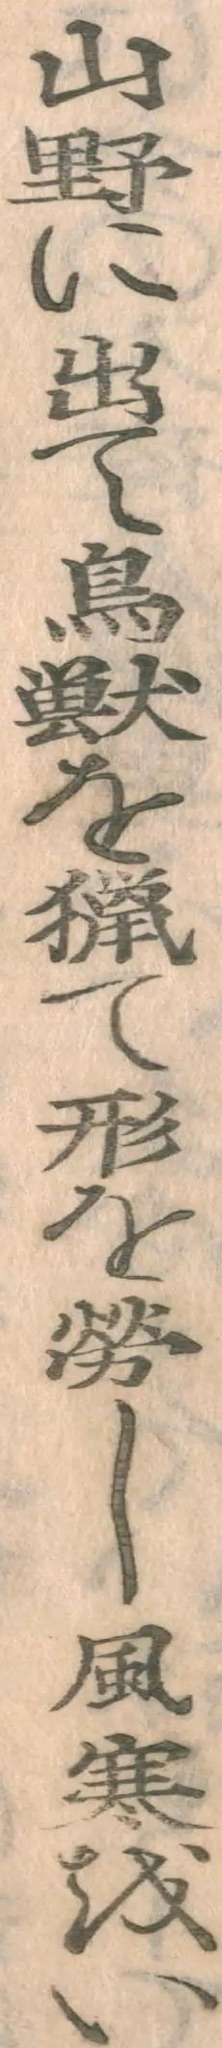山野に出て鳥獣を猟て形を労し風寒をい
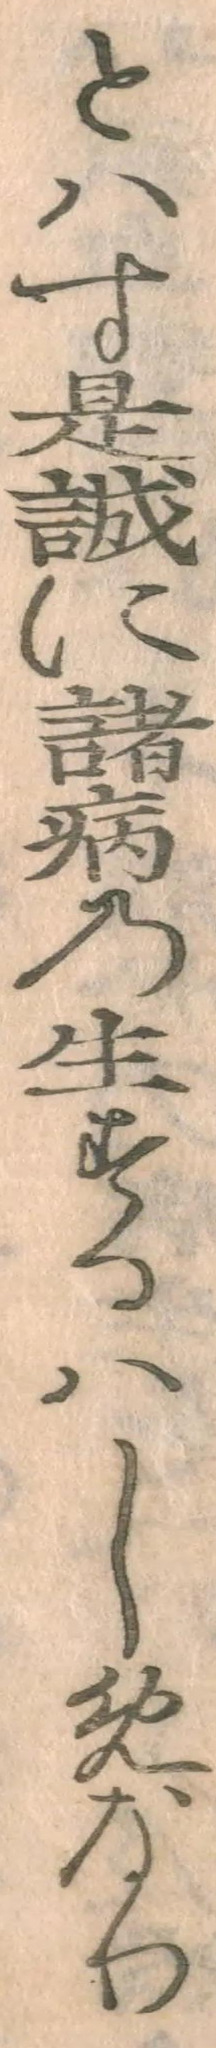とはす是誠に諸病の生するはしめなり
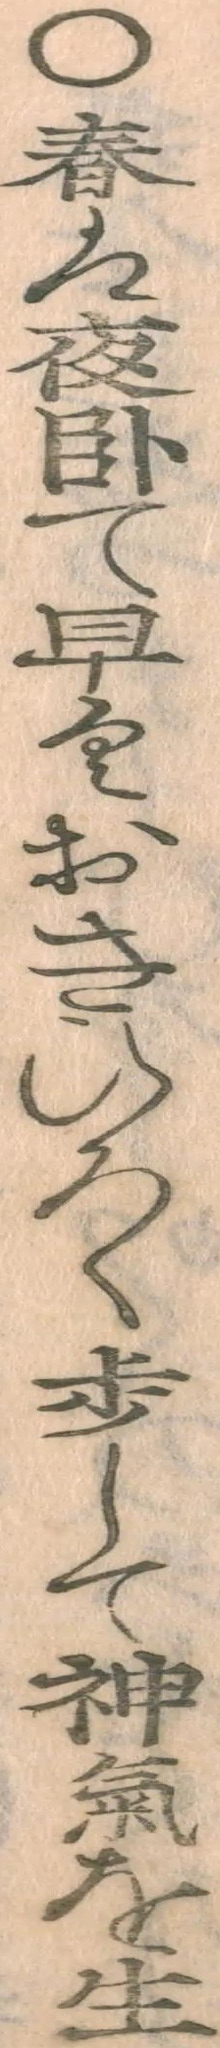〇春は夜臥て早くおきひろく歩して神気を生
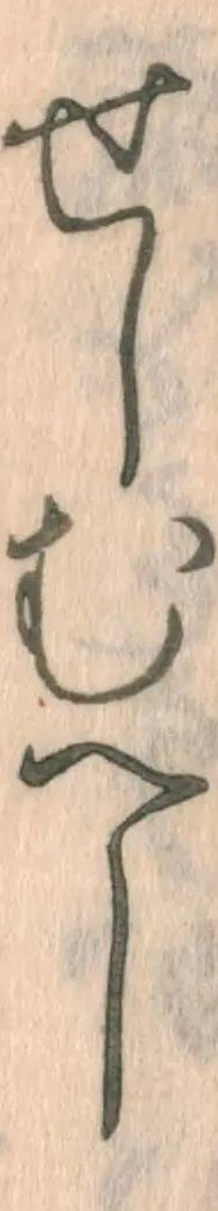せしむへし
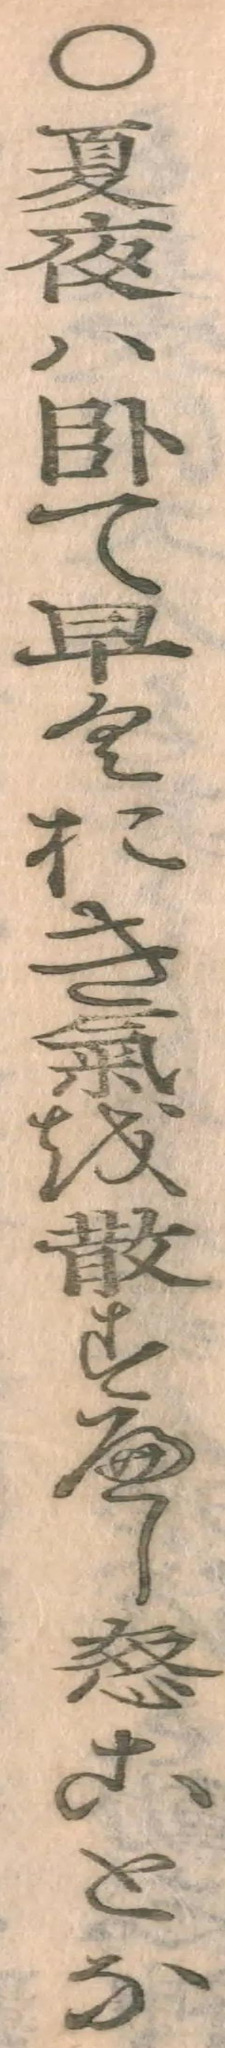〇夏夜は臥て早くおき気を散すへし怒ことな
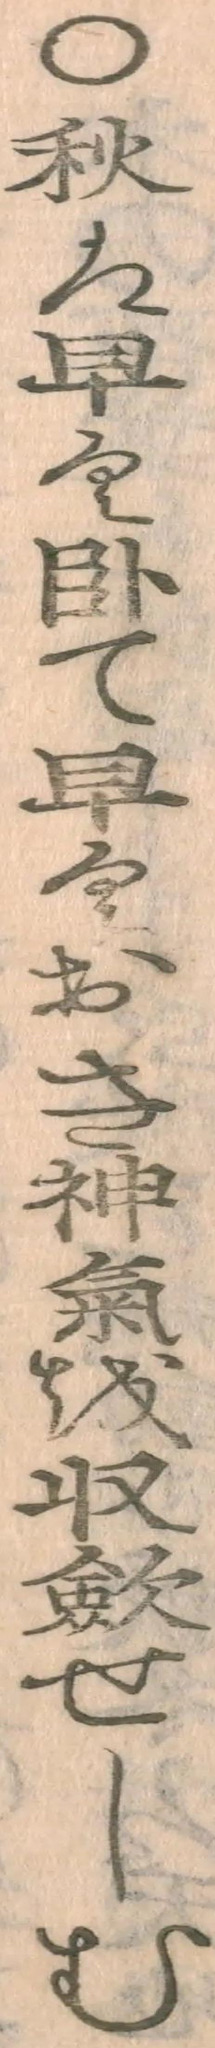〇秋は早く臥て早くおき神気を収歛せしむ
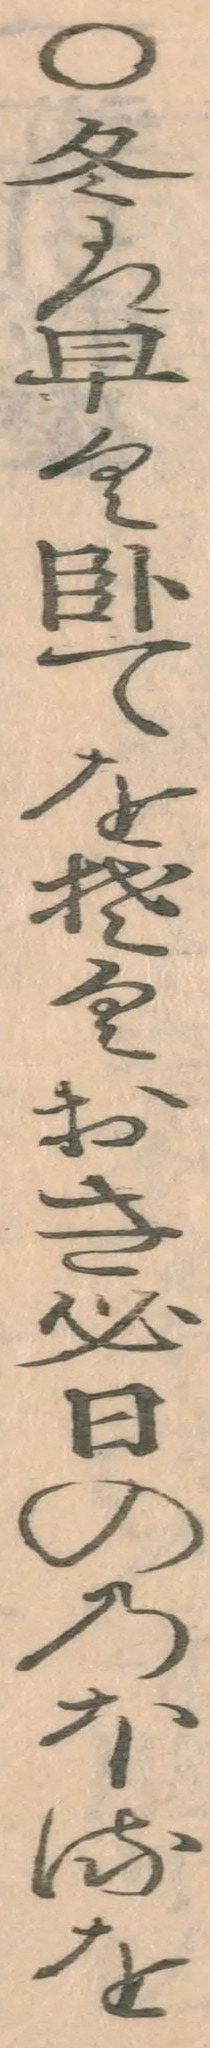〇冬は早く臥てをそくおき必日ののほるを
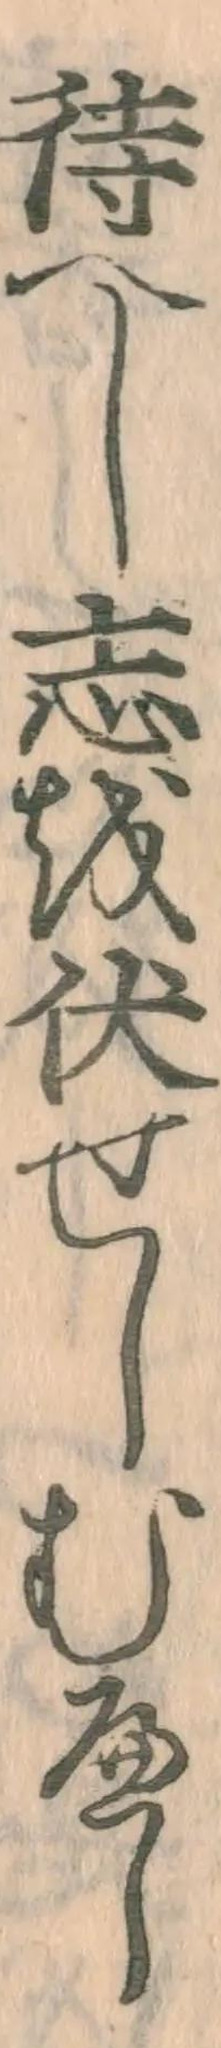待へし志を伏せしむへし
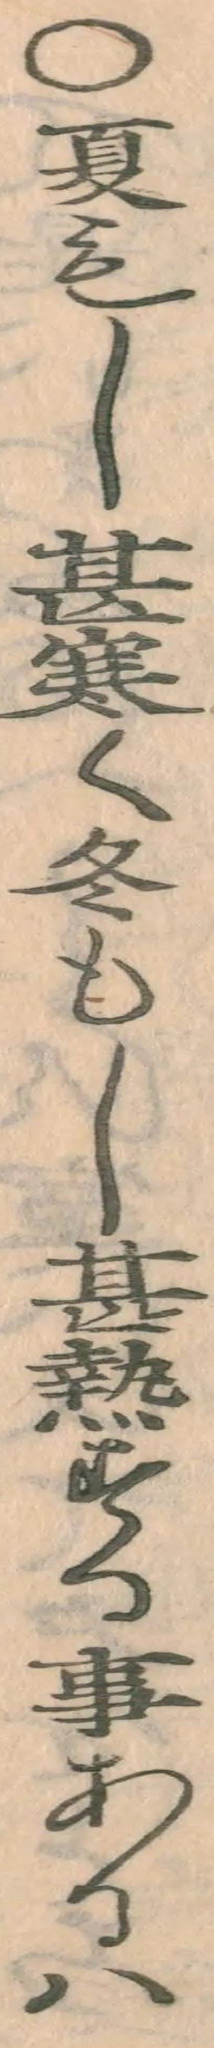〇夏もし甚寒く冬もし甚熱する事あるは
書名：延壽撮要
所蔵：国立国会図書館 National Diet Library, JAPAN
